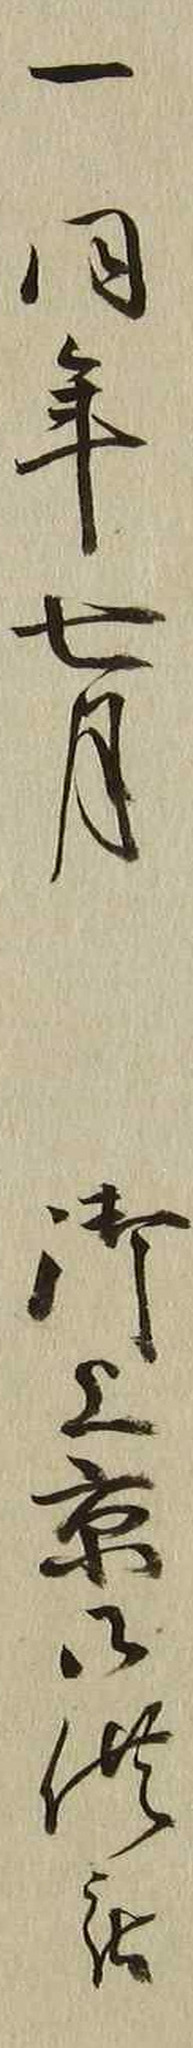一同年七月御上京御供被
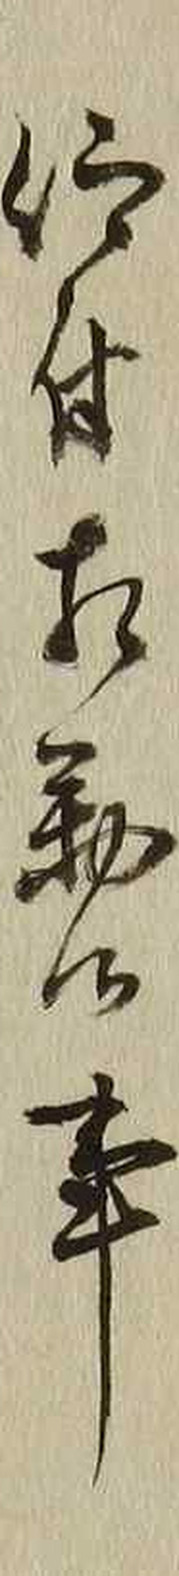仰付相勤候事
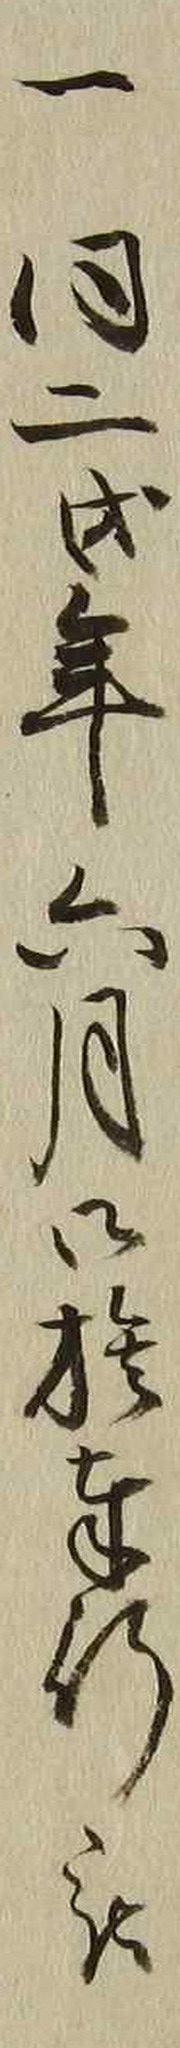一同二戌年六月御旗奉公被
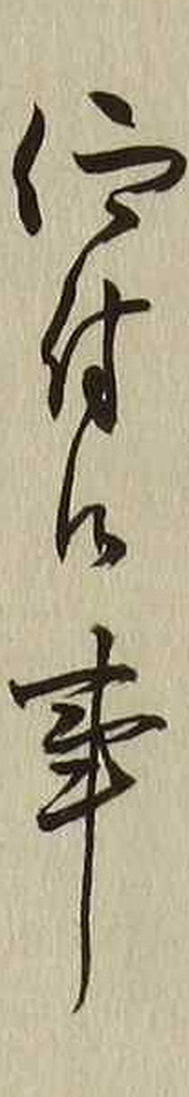仰付候事
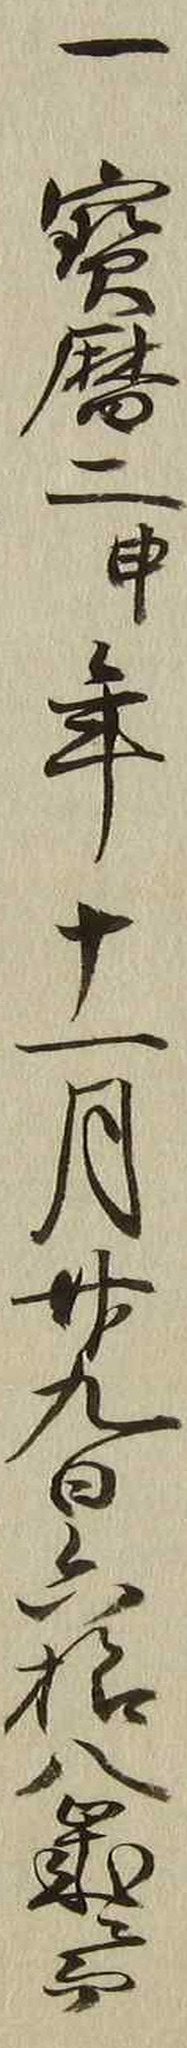一宝暦二申年十一月廿九日六拾八歳ニ而
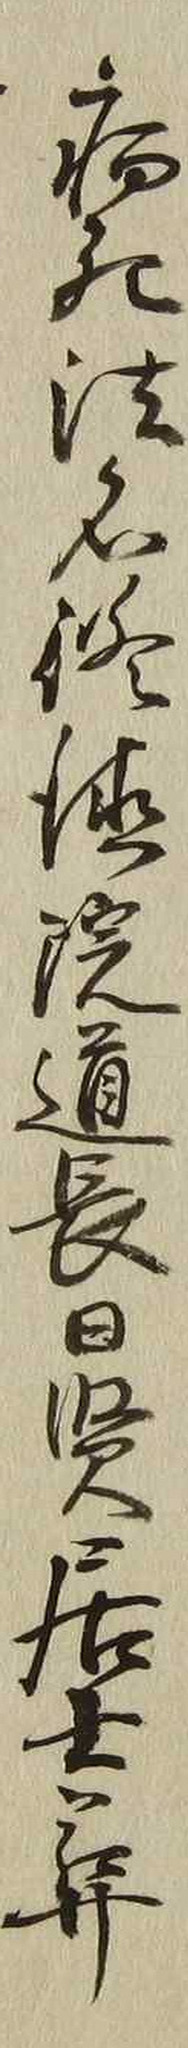病死法名修徳院道長日賢居士葬
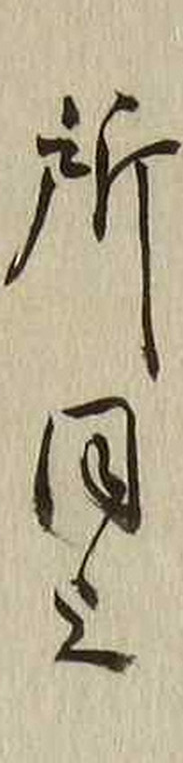所同上
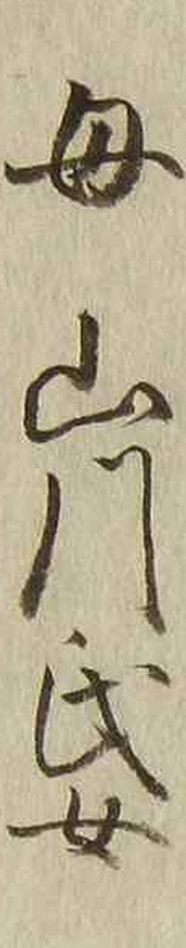母山川氏女

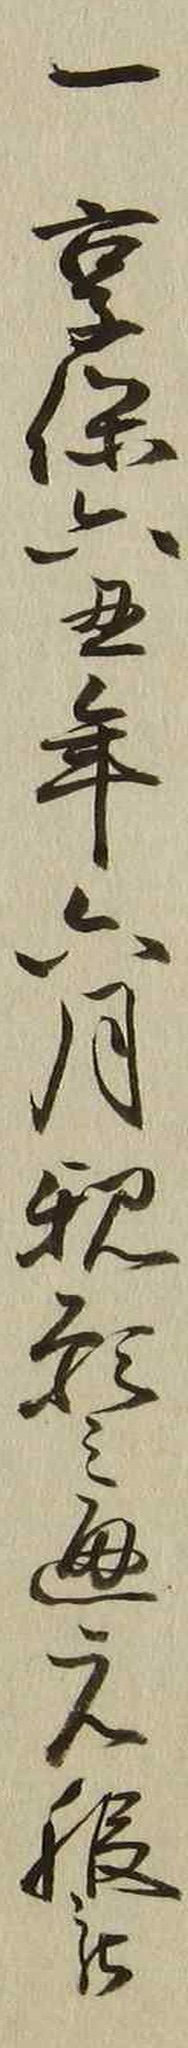一享保六丑年六月親願之通元服被
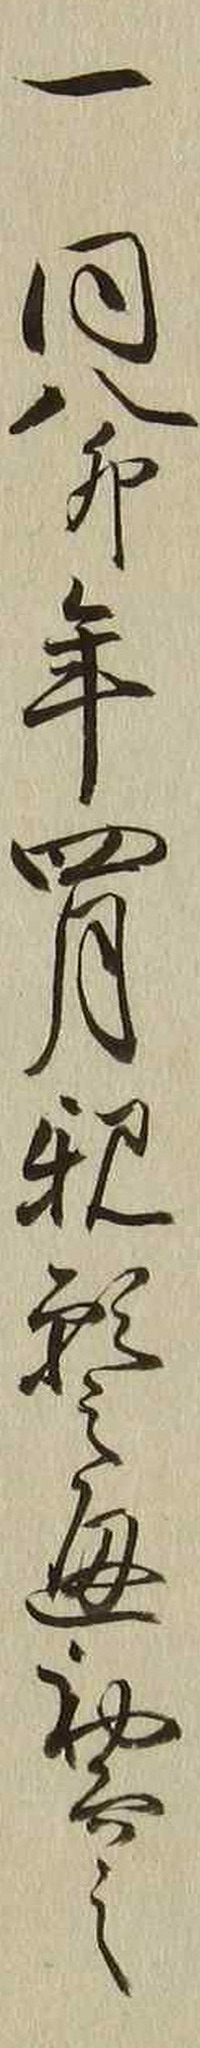一同八卯年四月親願之通初而之
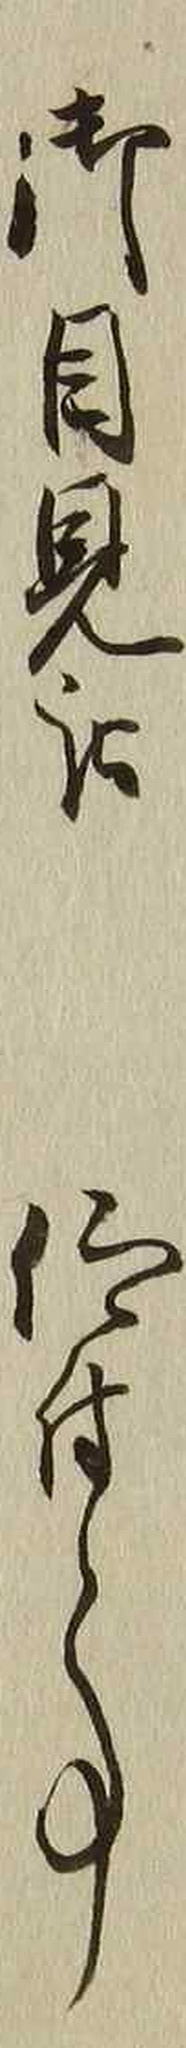御目見被仰付候事
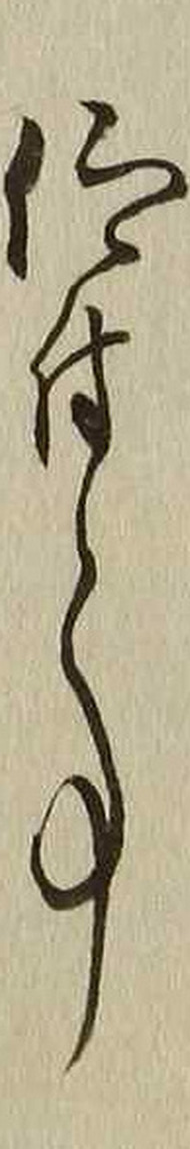仰付候事
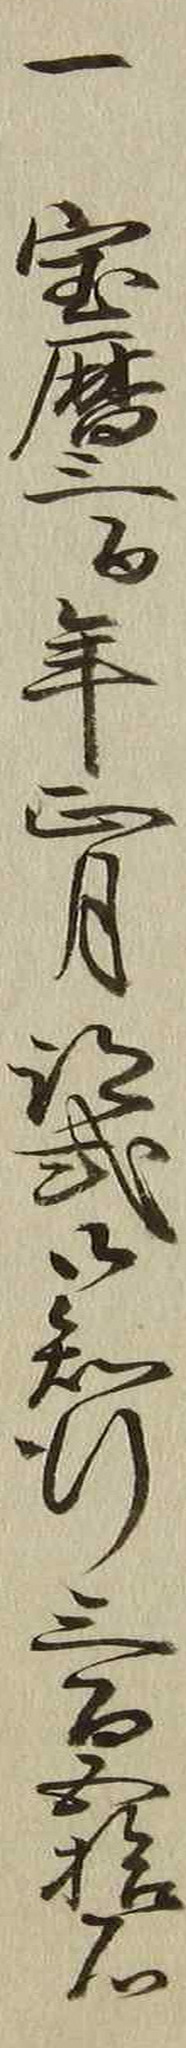一宝暦三酉年正月跡式御知行三百五拾石
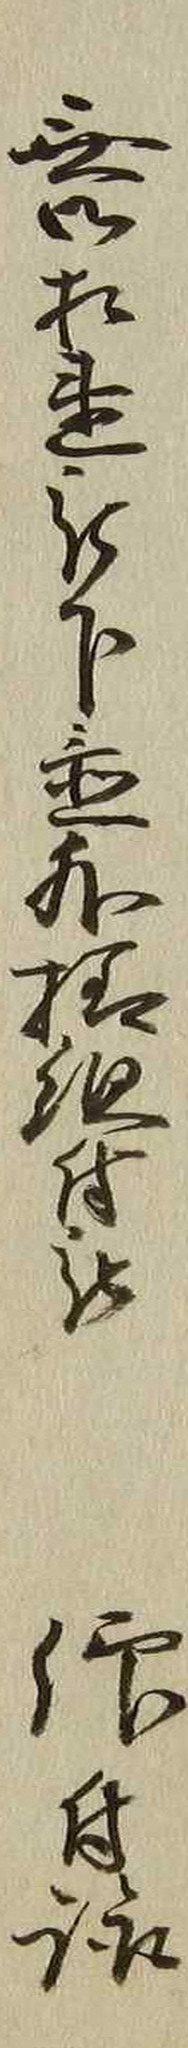無御相違被下置外様組付被仰付諏
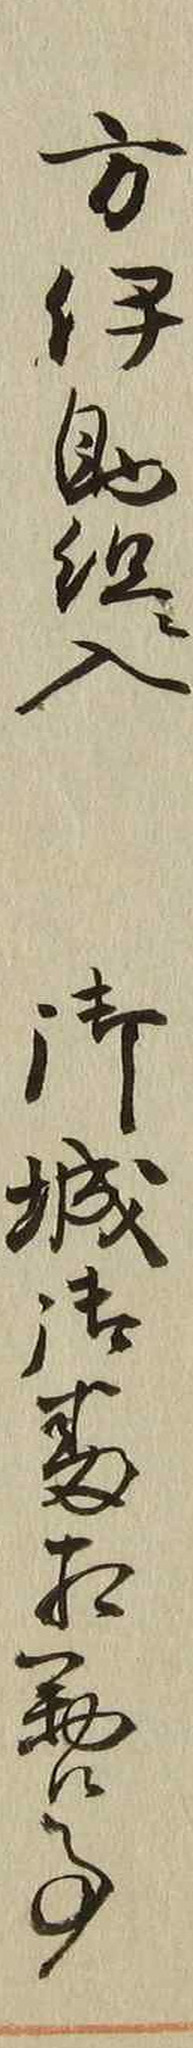方伊助組ニ入御城御番相勤候事
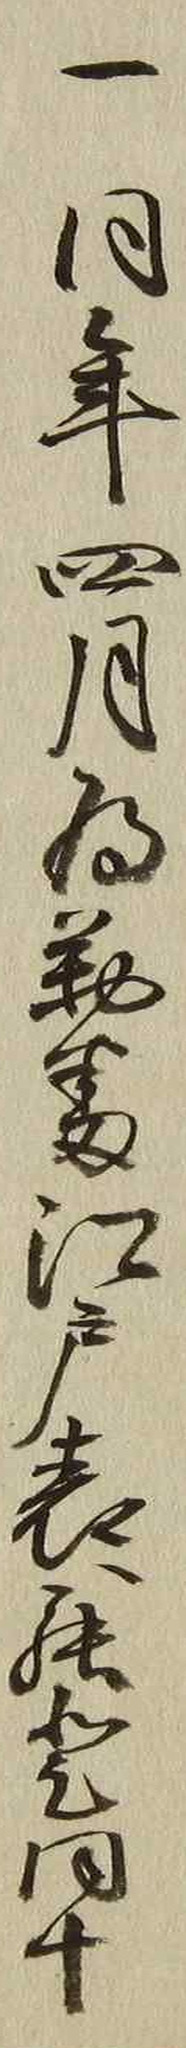一同年四月為勤番江戸表へ罷登同十
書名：諸士系譜　巻之60　と之部3
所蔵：会津若松市立会津図書館
